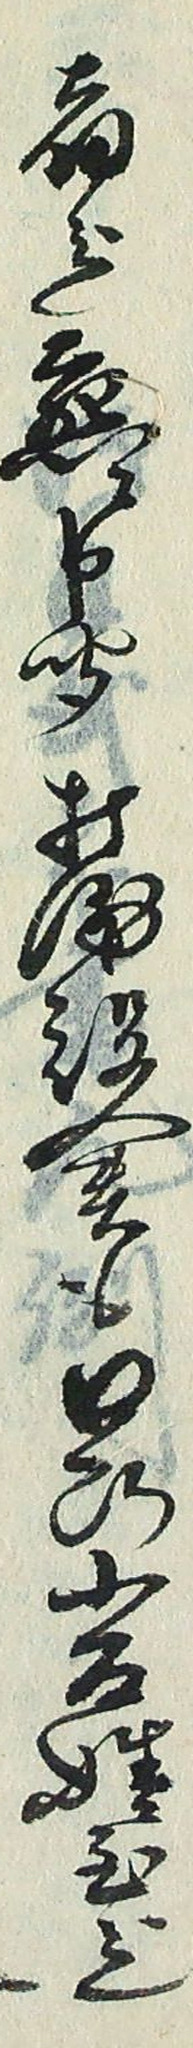者迄懇ニ申聞村浦役人共も同断小百姓ニ至迄
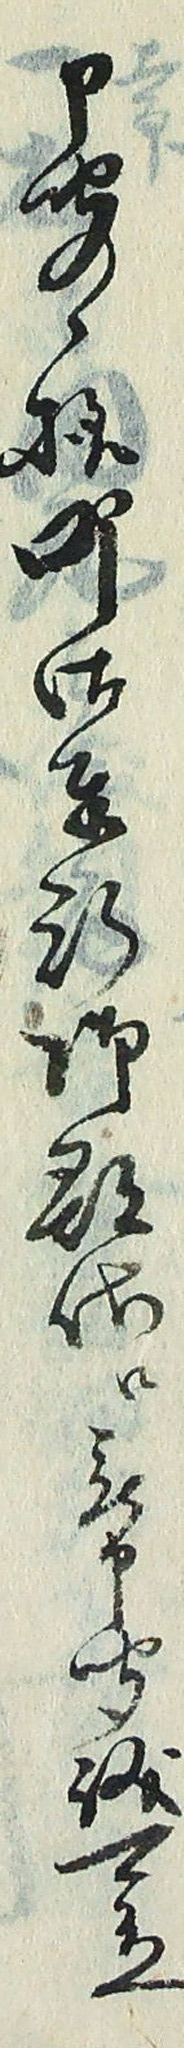申聞候様町御奉行御郡代江被申聞儀可有
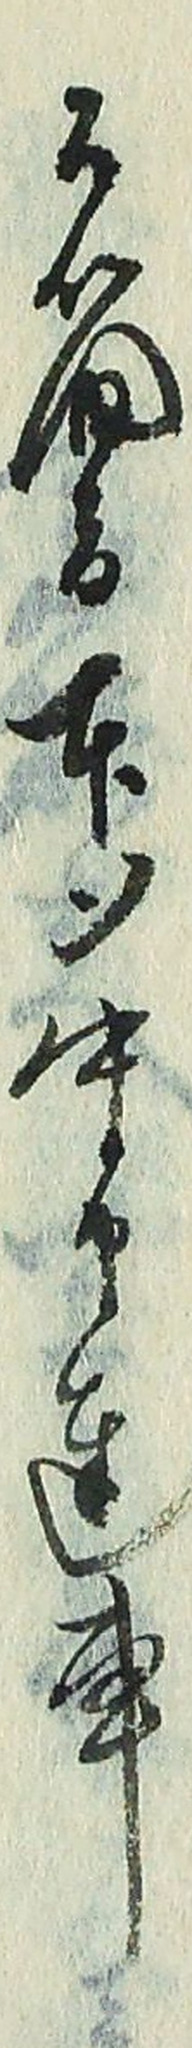了簡旨本〆中ニ申達事
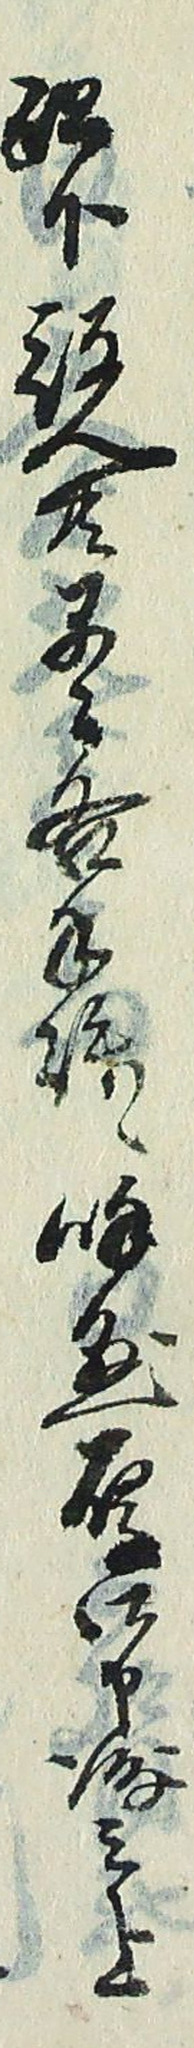組下役人共早々各手許へ呼懸厚御申渡之上
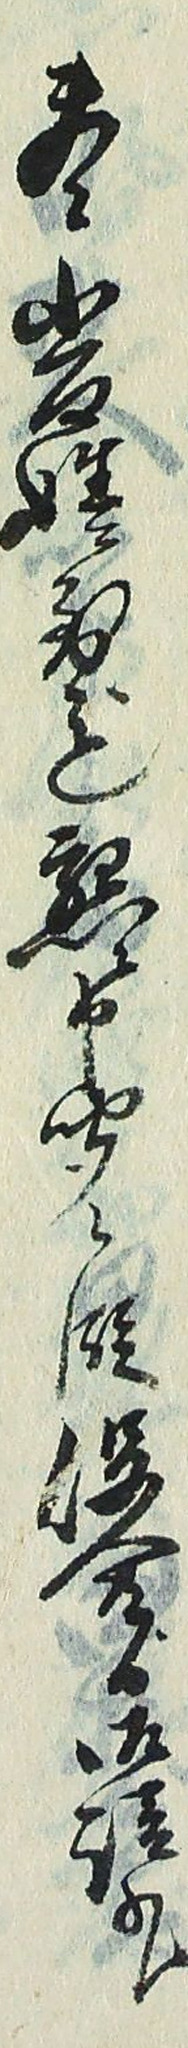夫々小百姓ニ至迄懇ニ申聞候段役人共ゟ請書
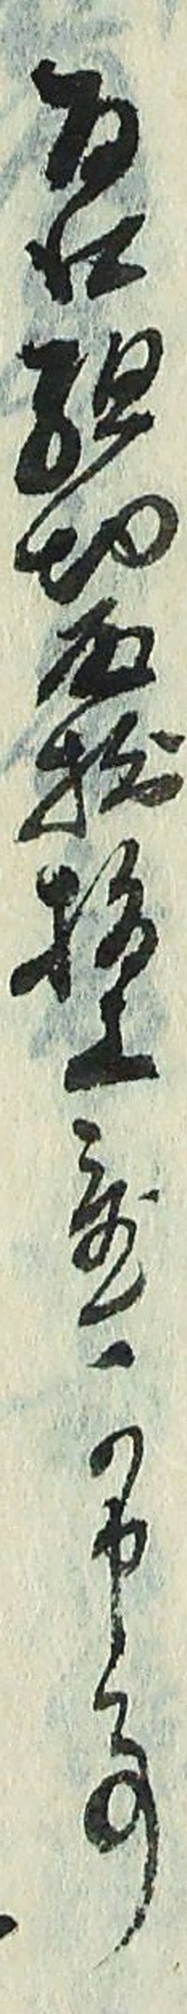為仕組切取揃指上置可申事
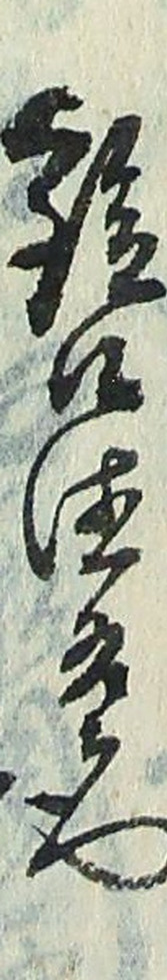鈴江徳右衛門
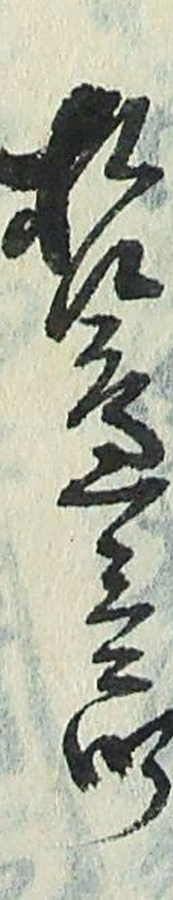松江島三郎
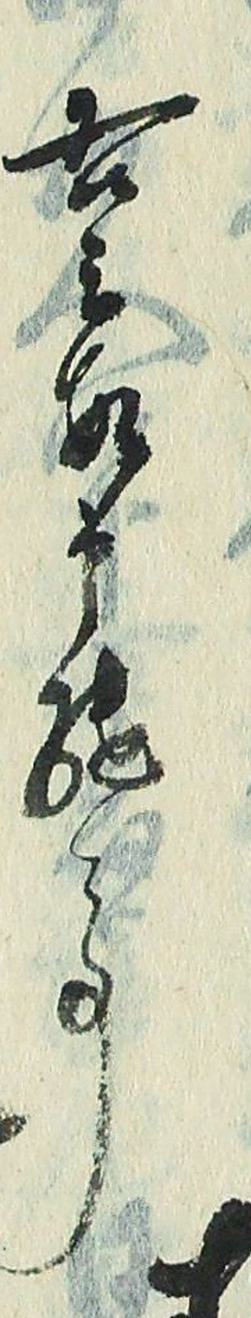右之段申継候事
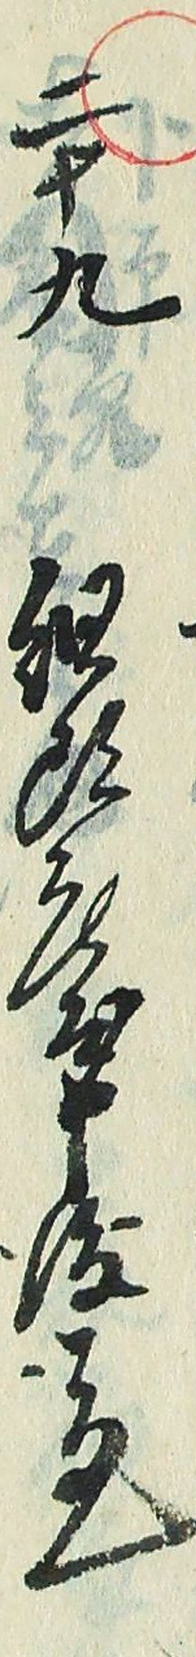○二十九組頭庄屋申渡覚
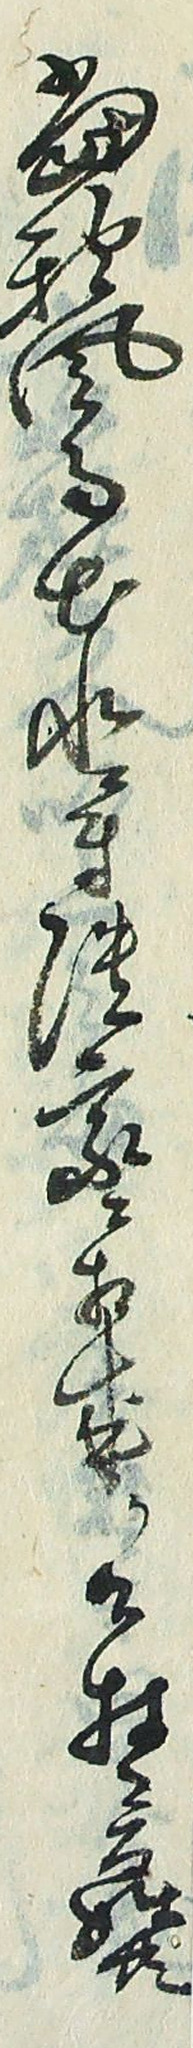當秋風雨出水ニ付潰家ニ相成り候村々百姓共
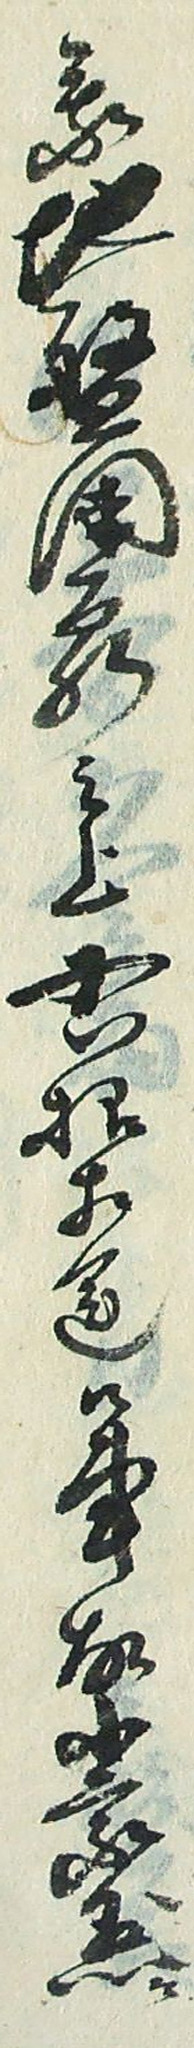義地盤困窮之上右様相運候事故小家懸ケ

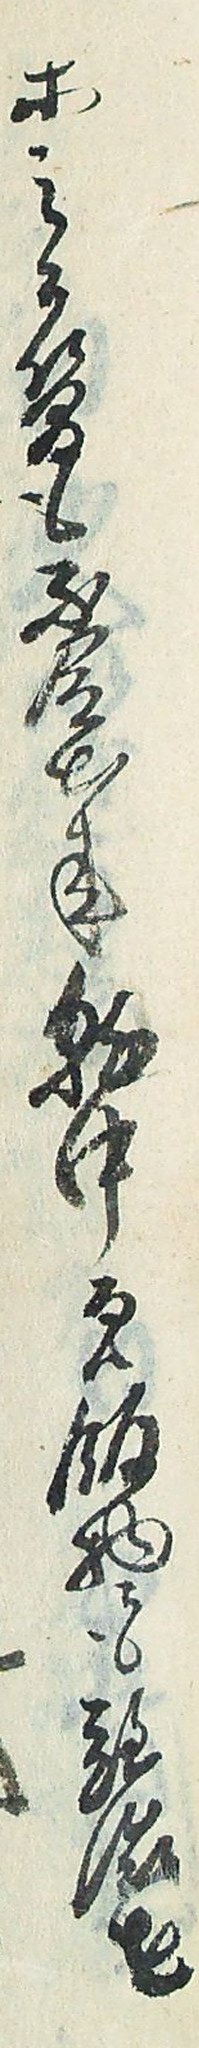等之了簡も不令出来就中而ハ飯物ニも難渋せ
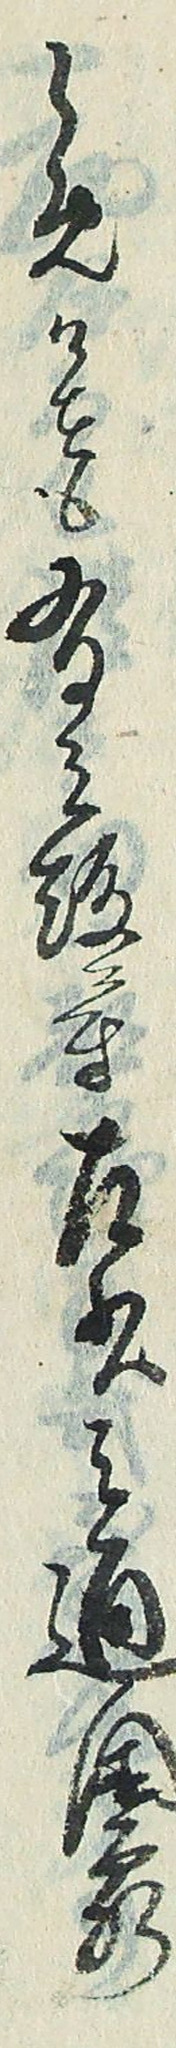しめ候者も有之趣ニ付左書之通困窮
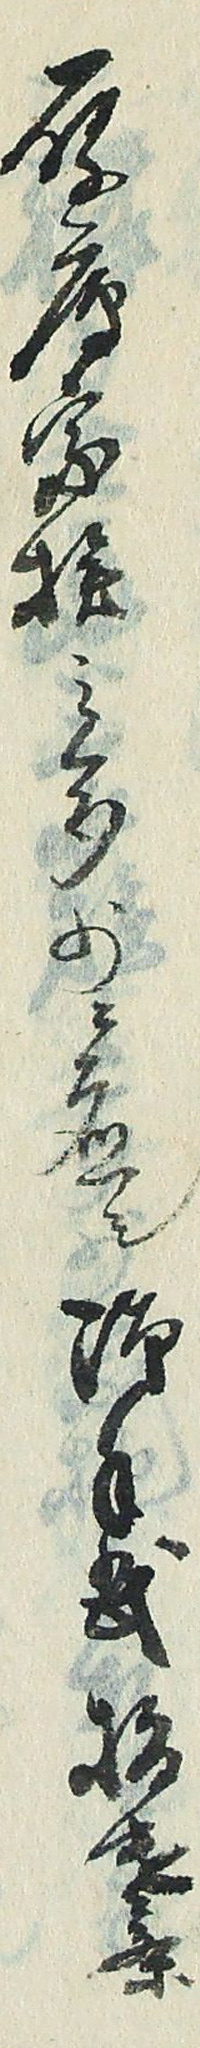厚薄家族之多少ニ應シ御手當指遣候条
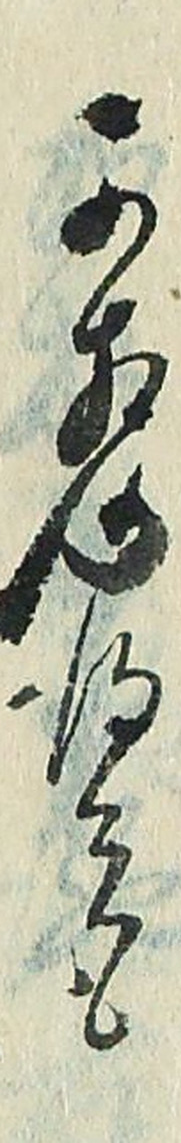可相心得候以上
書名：諸御趣意書并御下知向之写
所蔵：鳴門教育大学 Naruto University of Education
